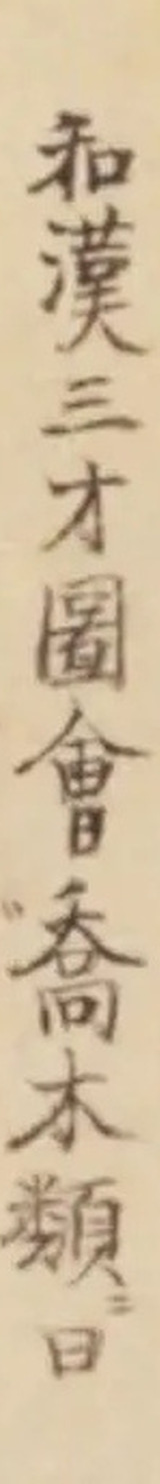和漢三才圖會喬木類ニ曰
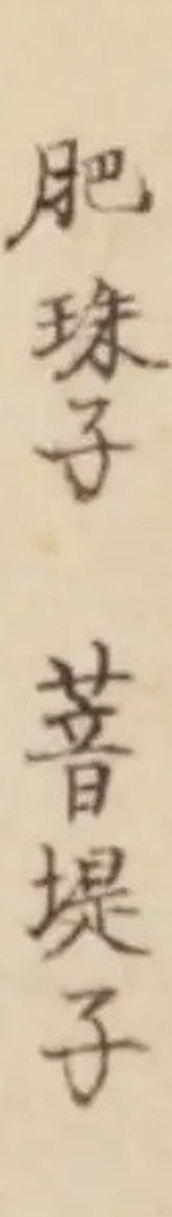肥珠子菩提子
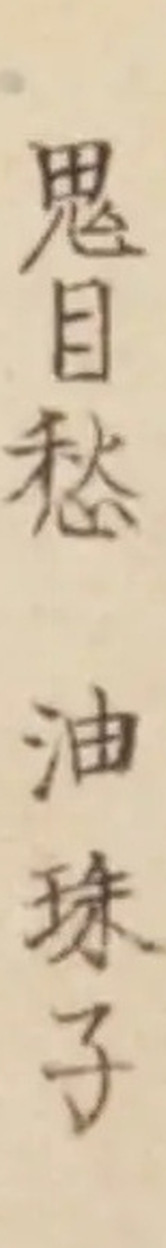鬼目愁油珠子
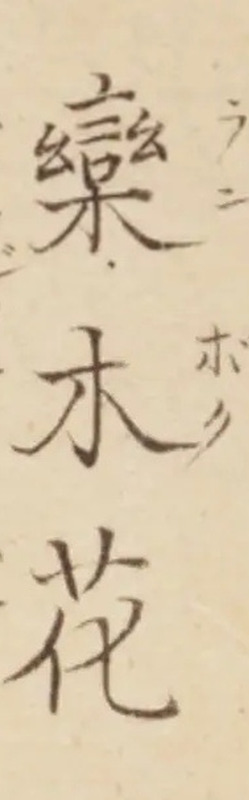欒木花
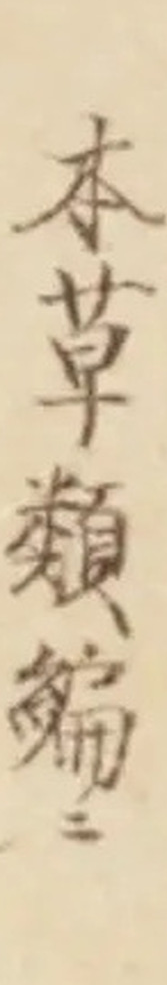本草類編ニ
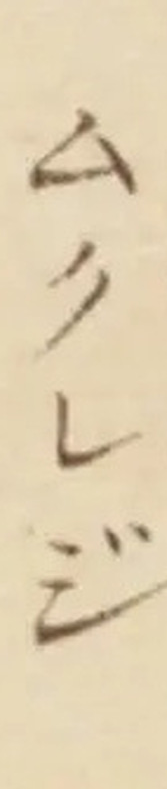ムクレジ
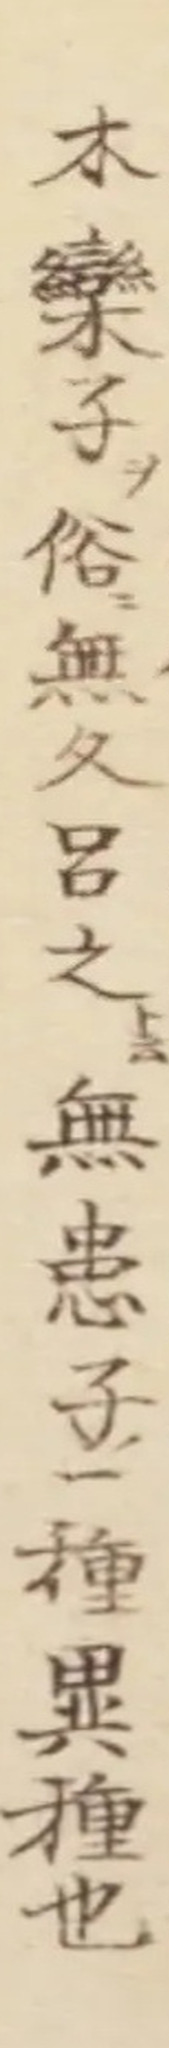木欒子を俗に無久呂之と云無患子の一種異種也
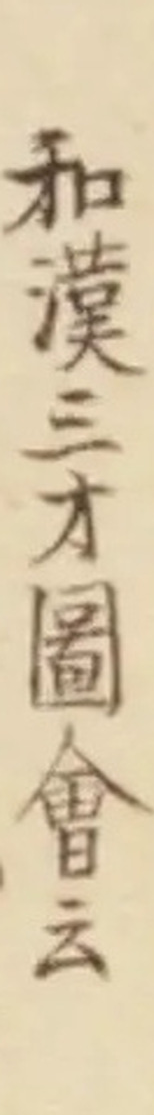和漢三才圖會云
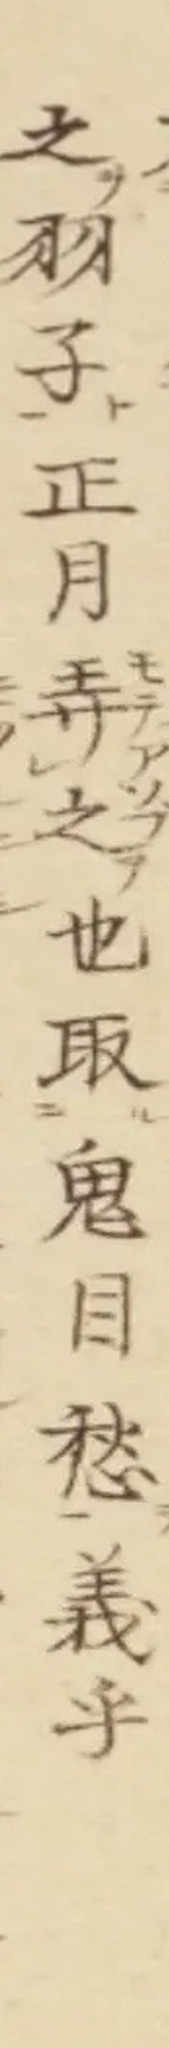之ヲ羽子正月弄之ヲ也取ル鬼目愁ヲ義乎
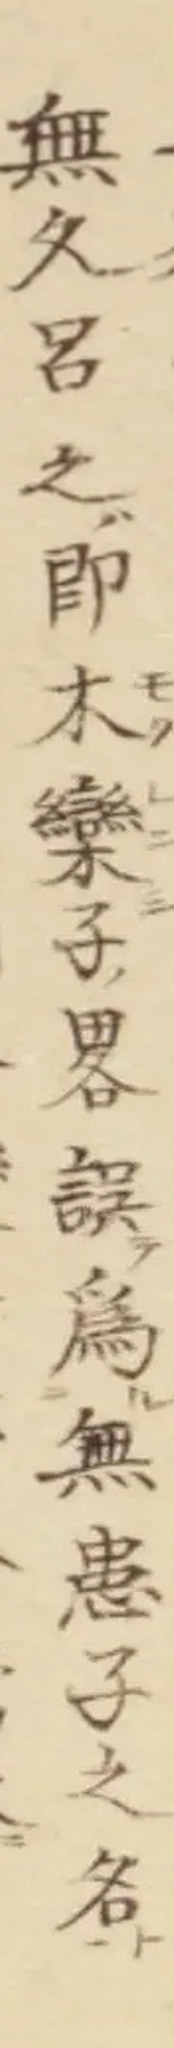無久呂之ハ即木欒子ノ畧誤を爲ル無患子之名ト
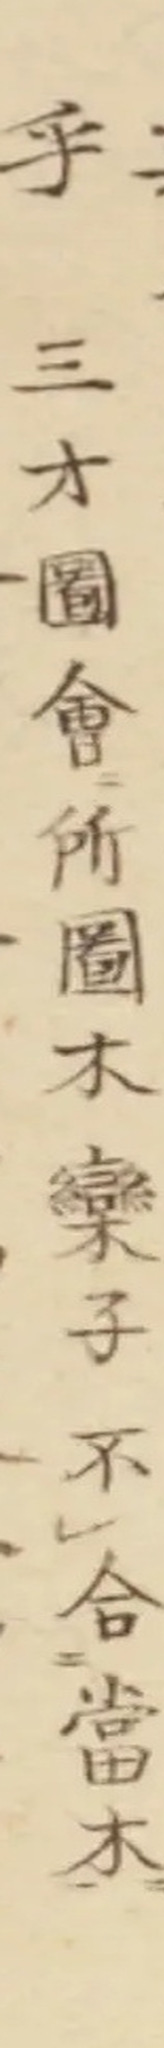乎三才圖會ニ所圖木欒子不合當木ニ
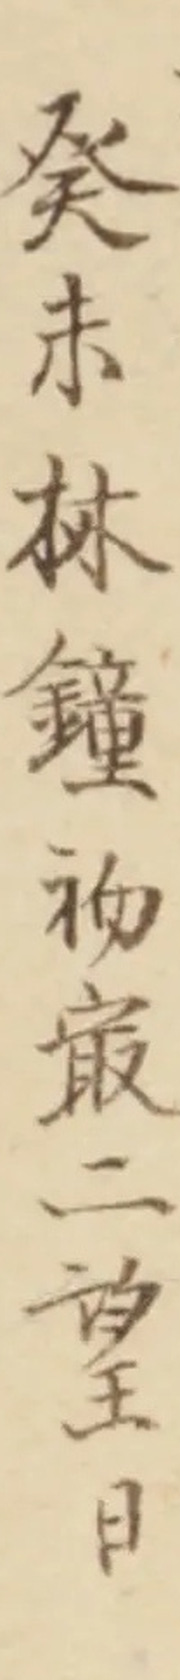癸未林鐘初二望日
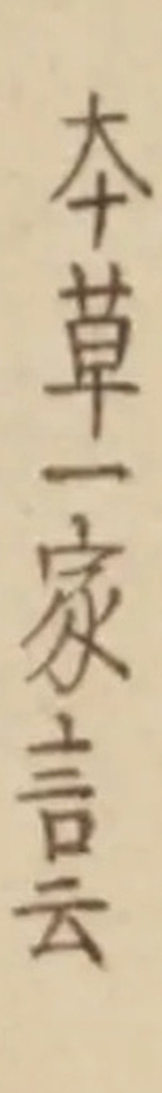本草一家言云
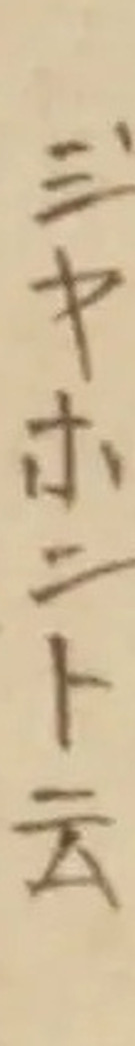ジヤホント云

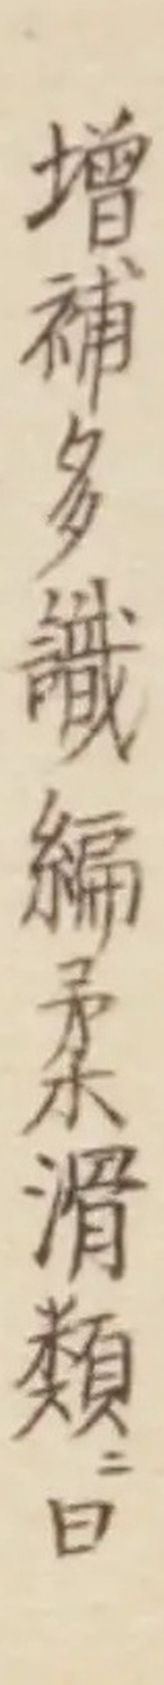増補多識編柔滑類ニ曰
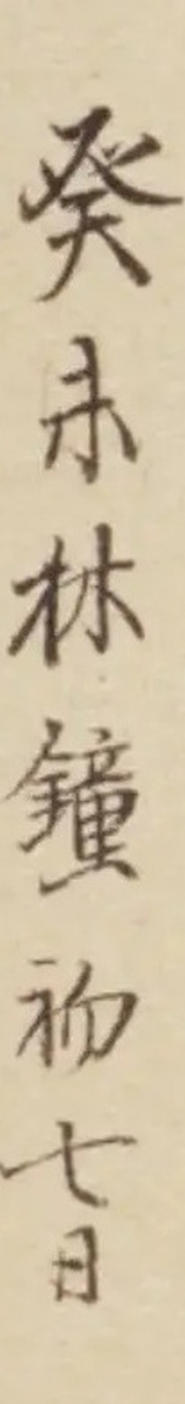癸未林鐘初七日
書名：梅園草木花譜夏之部. 2
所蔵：国立国会図書館 National Diet Library, JAPAN
